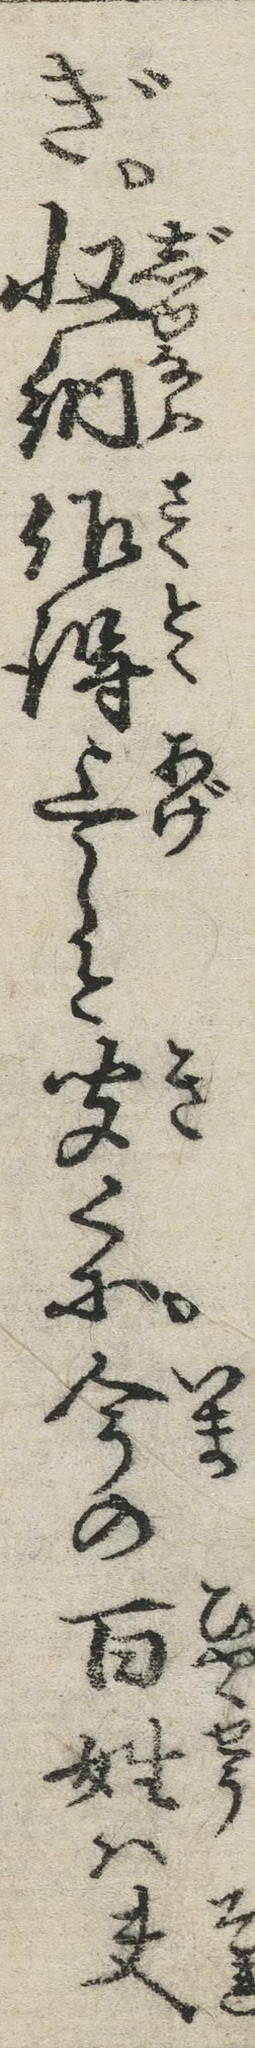ぎ。収納作得上しと聞くに。今の百姓は夫
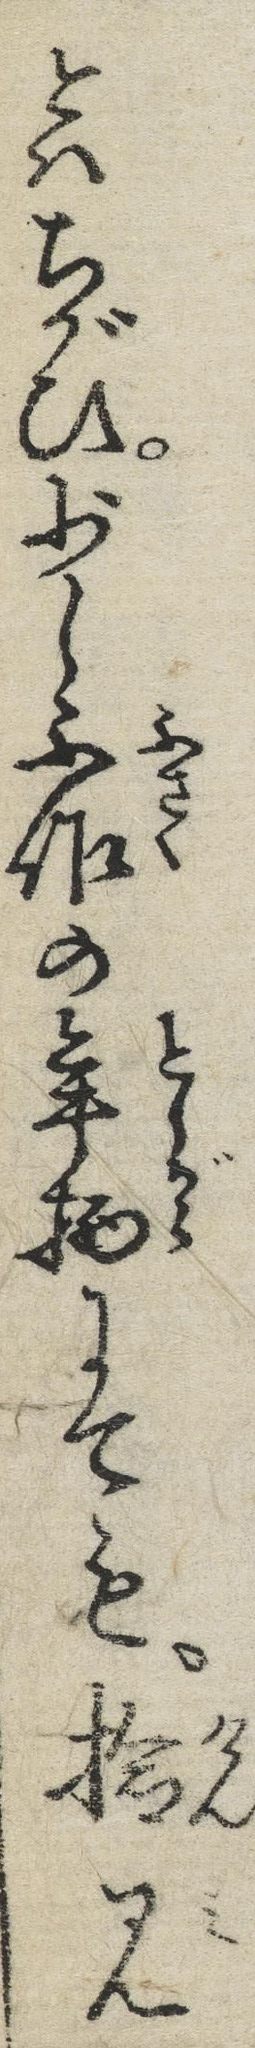とはちがひ。少し不作の年柄にても。検見

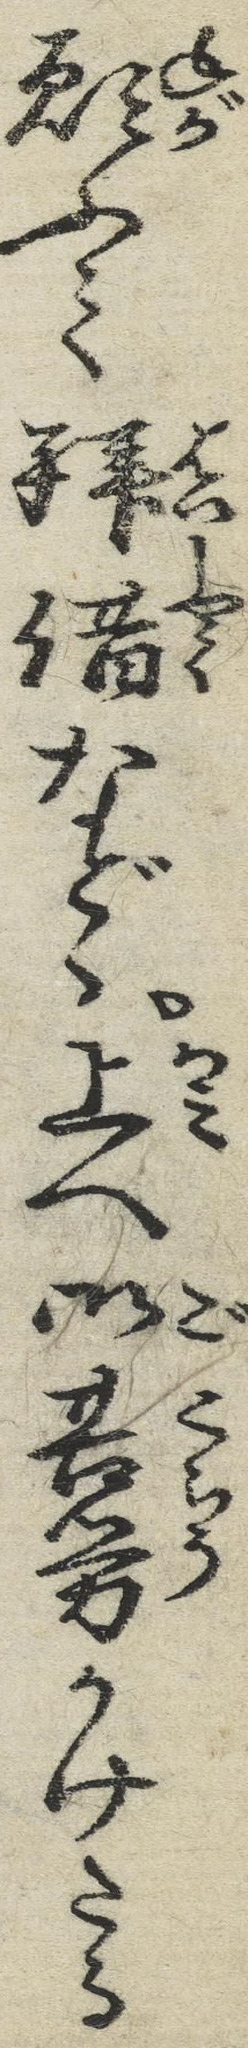願ふて拝借などゝ。上へ御苦労かけたる
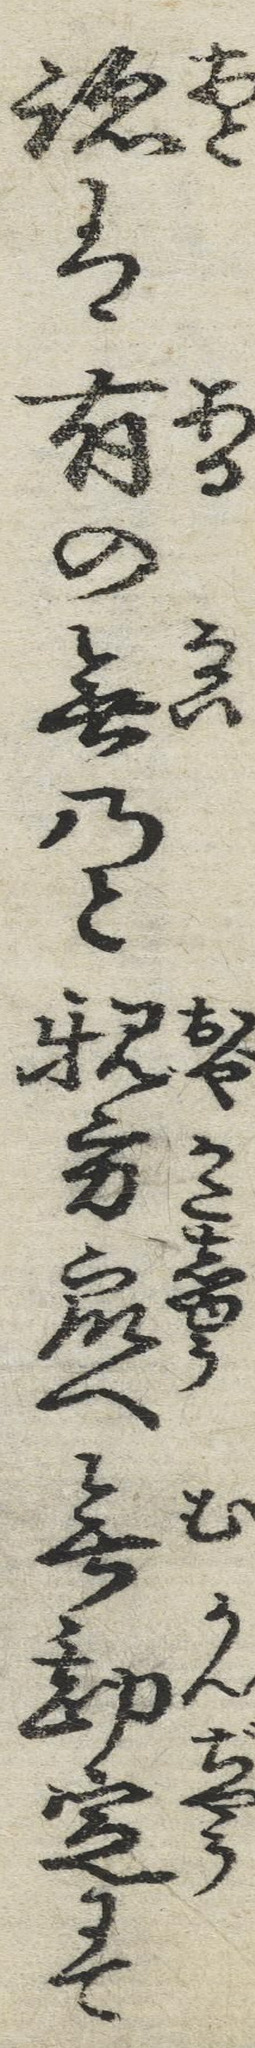跡は有の無のと親方衆へ無勘定にて
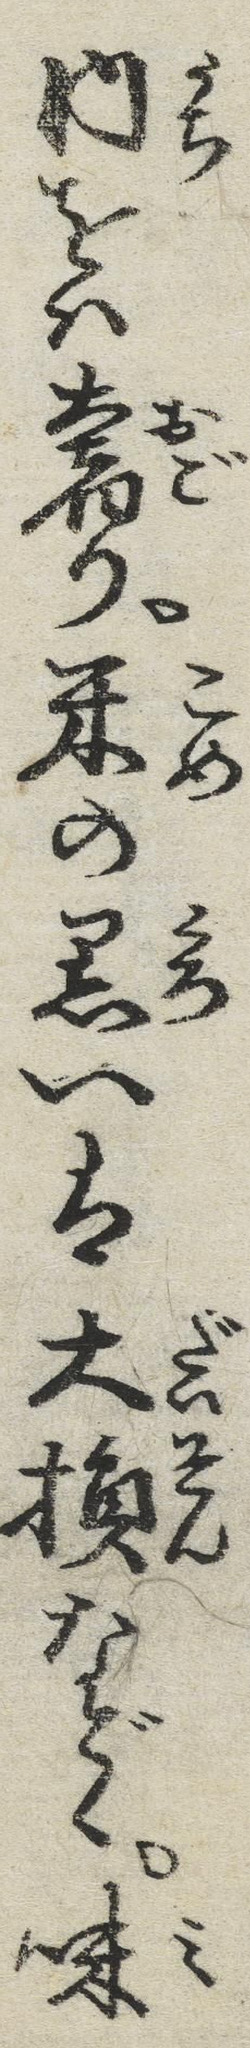内をは奢り。米の黒いは大損などゝ。味
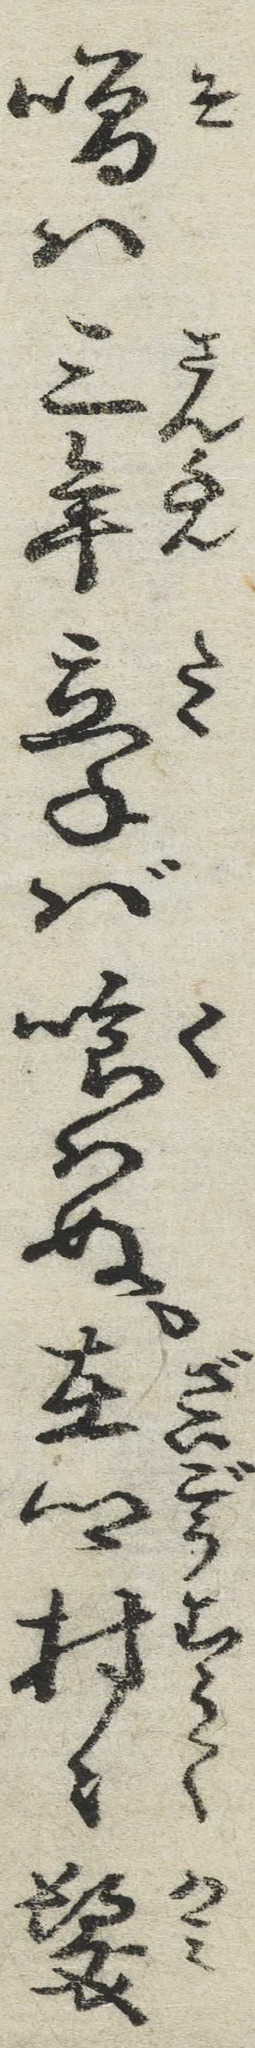噌は三年立ねば喰はぬ。在郷村々髪
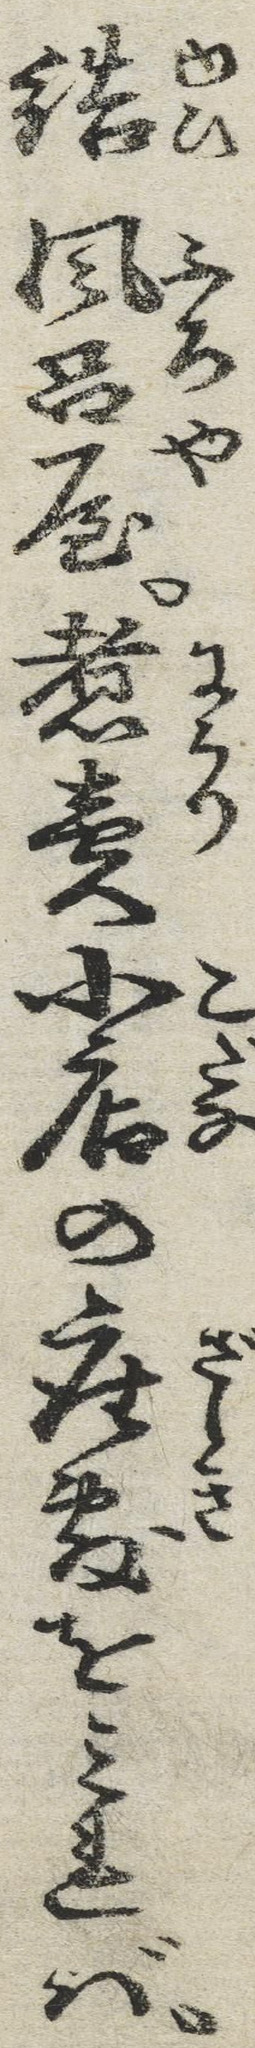結風呂屋。煮売小店の座敷をみれば。
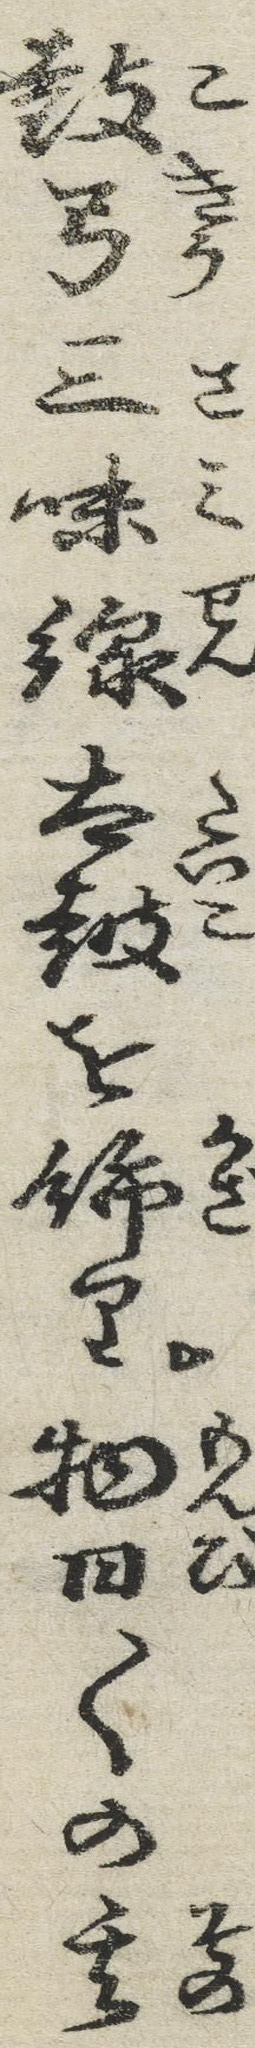胡弓三味線太鼓を飾り。物日〳〵の其
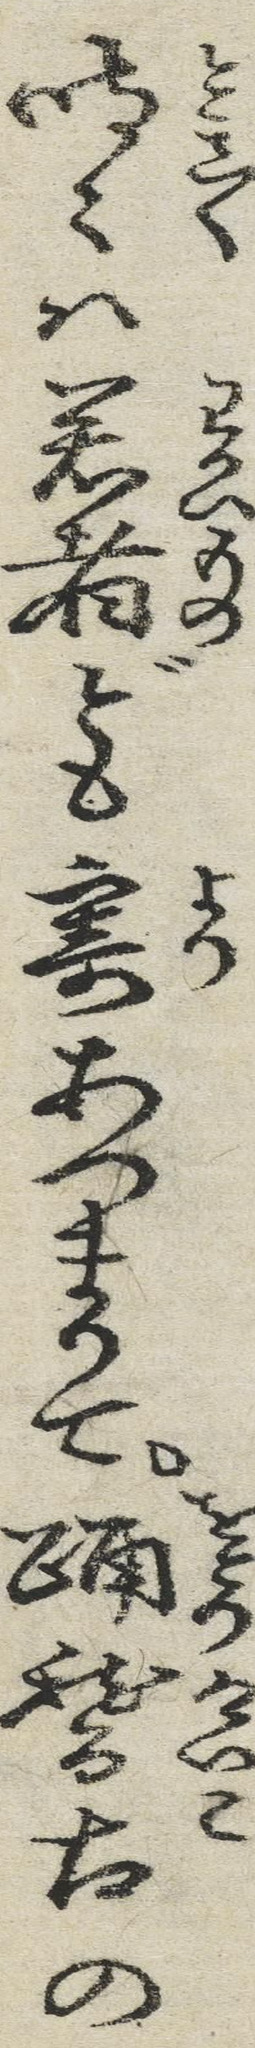時々は若者ども寄あつまりて。踊稽古の
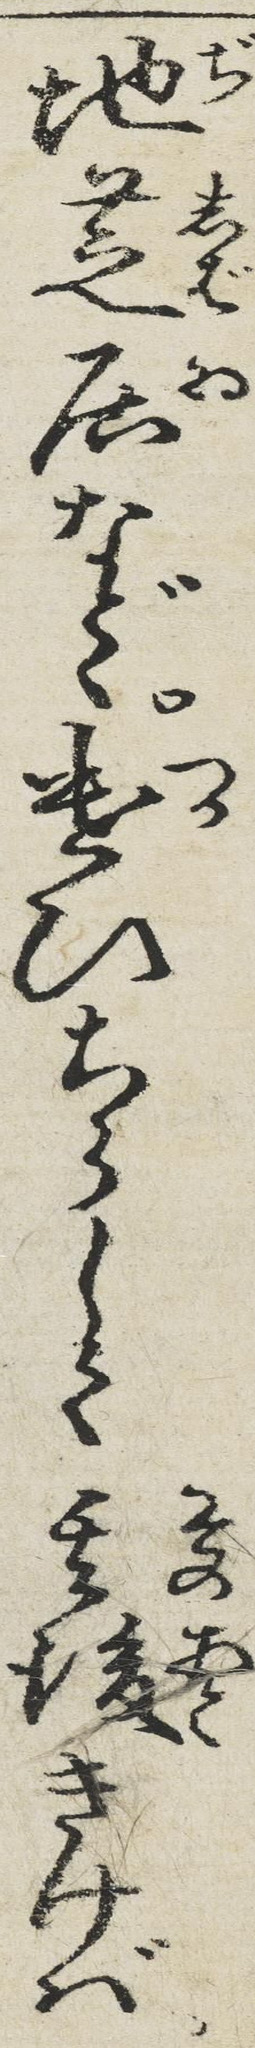地芝居などゝ。遣ひちらして其後きけば
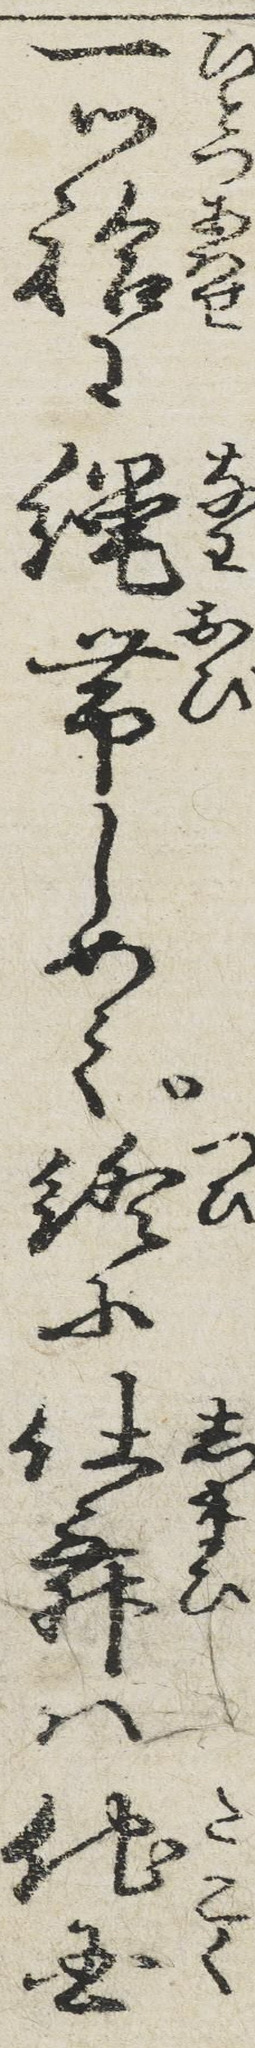一つ袷に縄帯しめて。終に仕舞は他国
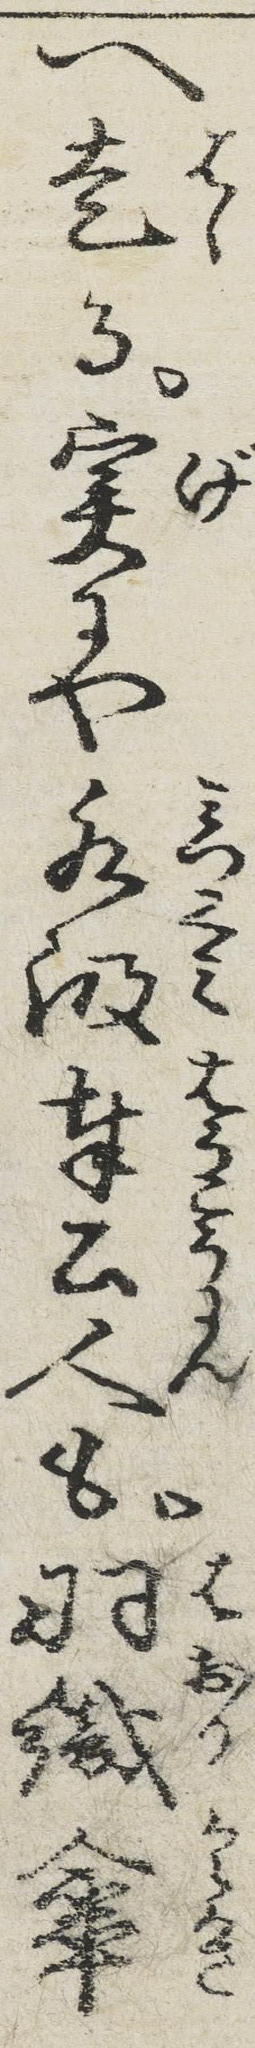へ走る。実にや水汲奉公人も。羽織傘
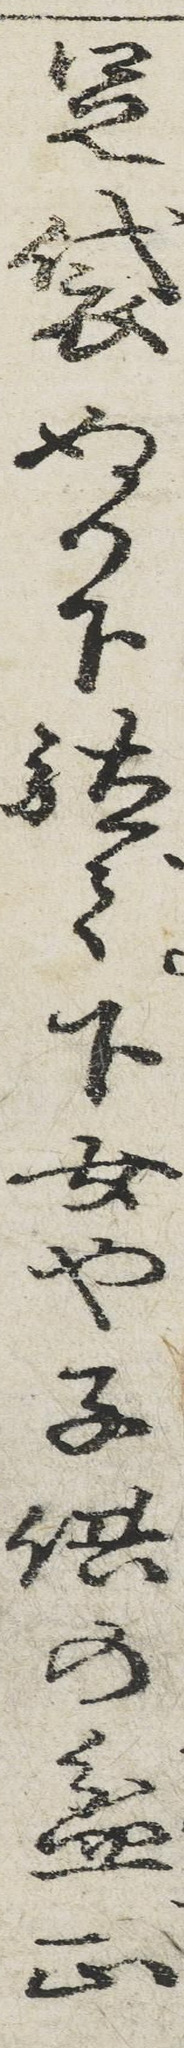足袋ぬり下駄で。下女や子供の盆正
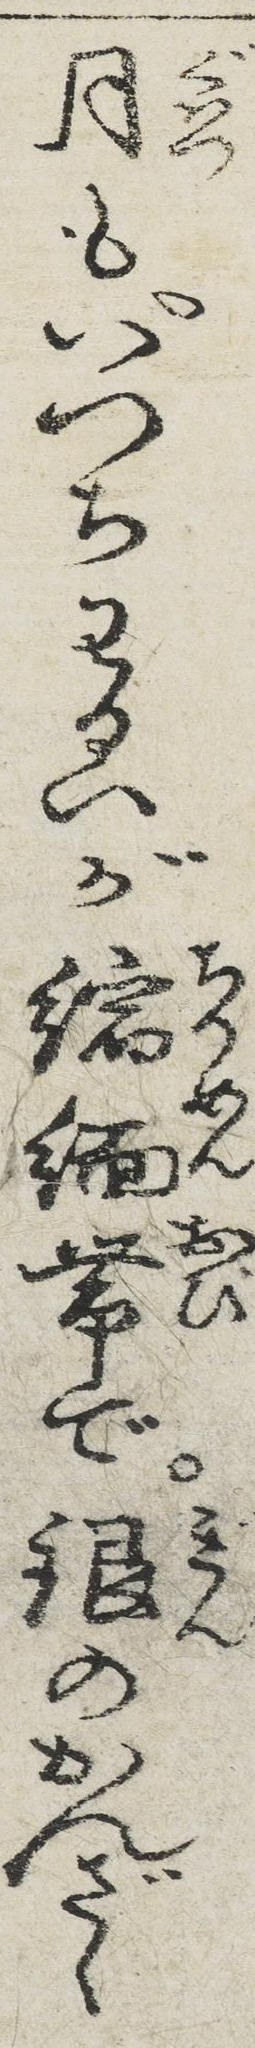月も。いつちわるいが縮緬帯で。銀のかんざし
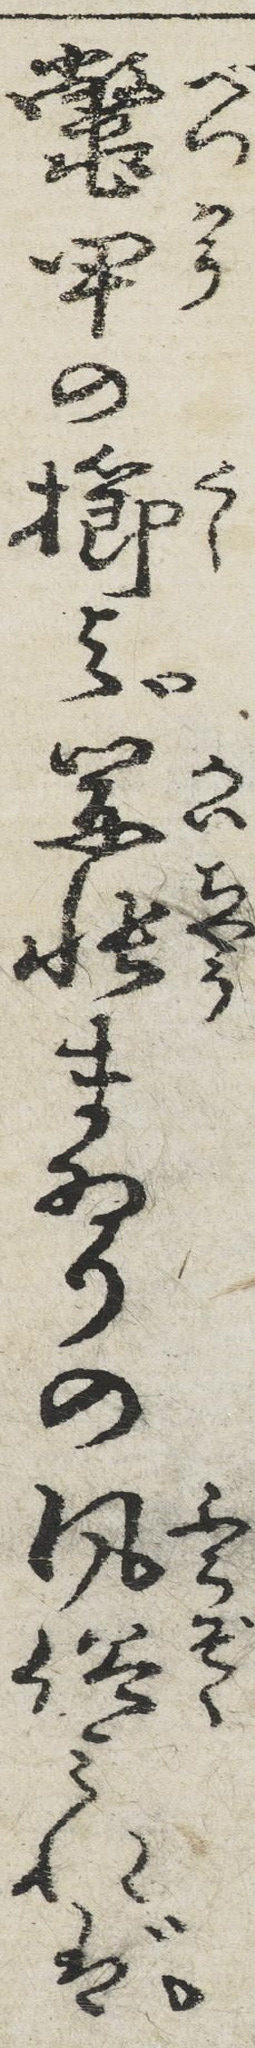鼈甲の櫛よ。開帳まゐりの風俗みれば。
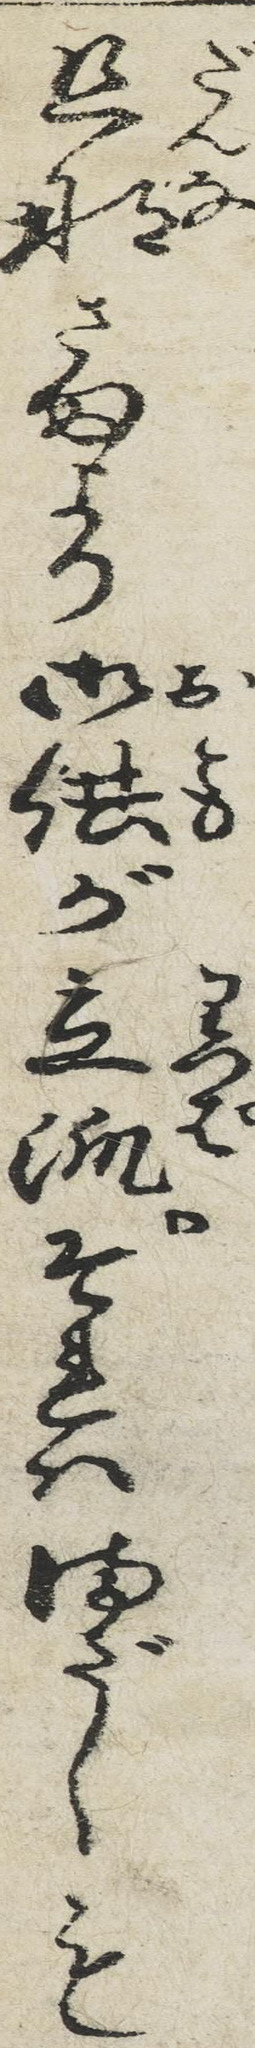旦那さまより御供が立派。それはまだしも
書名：越後地震口説
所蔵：東京大学地震研究所図書室 Earthquake Research Institute Library, The University of Tokyo, JAPAN
